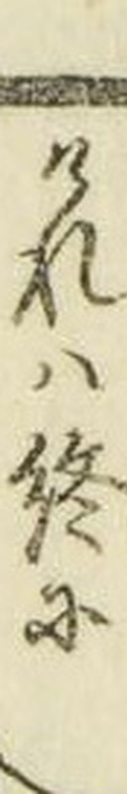けれは終に
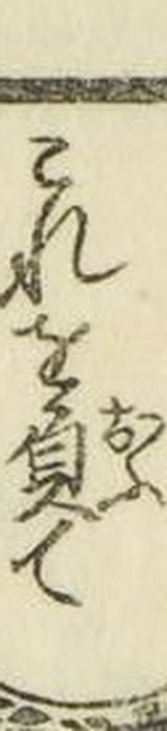これを負て
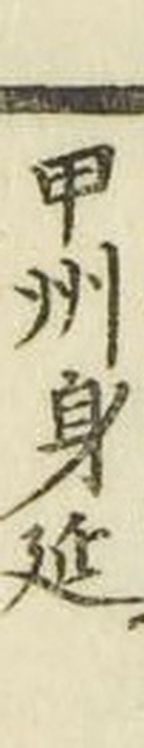甲州身延
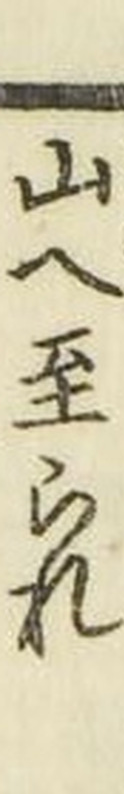山へ至られ
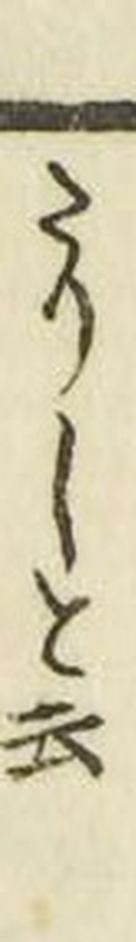たりしと云
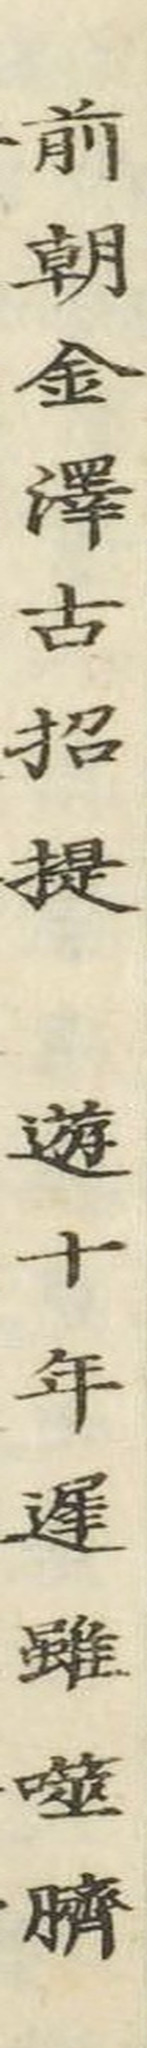前朝金澤古招提遊十年遅雖噬臍
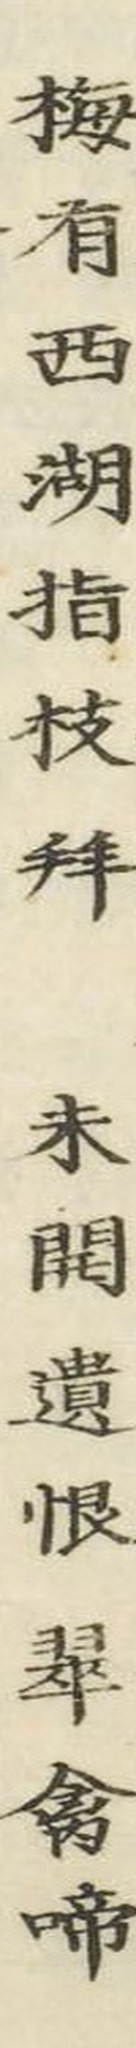梅有西湖指枝拜未開遺恨翠禽啼
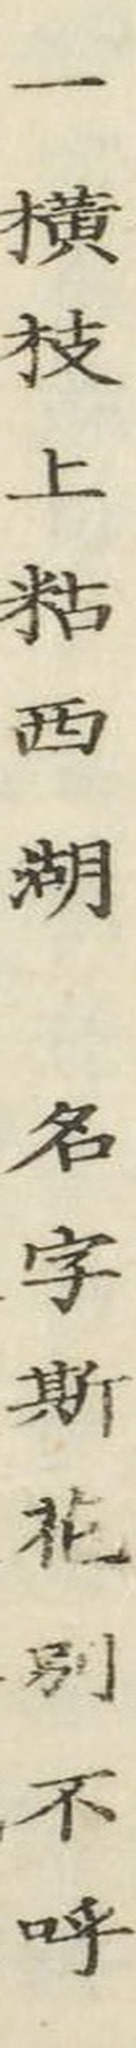一横枝上粘西湖名字斯花別不呼
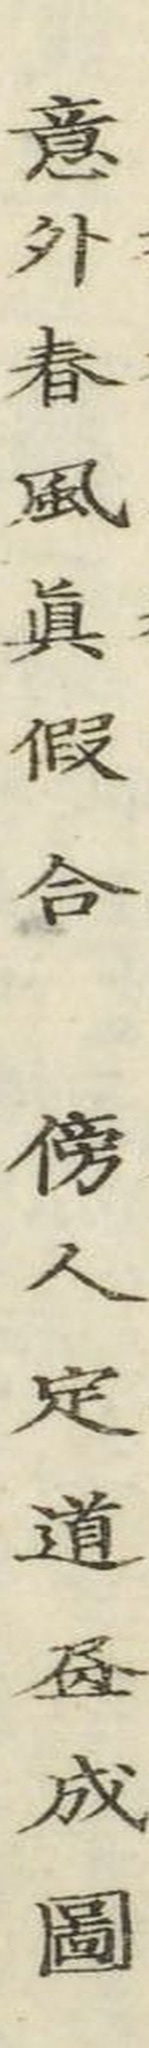意外春風眞假合傍人定道昼成圖
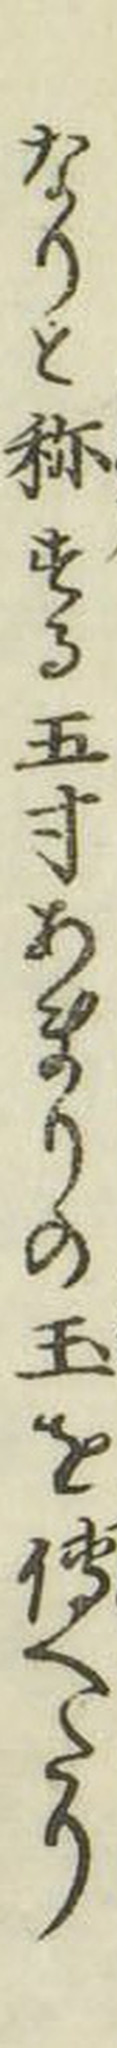なりと称する五寸あまりの玉を傳へたり

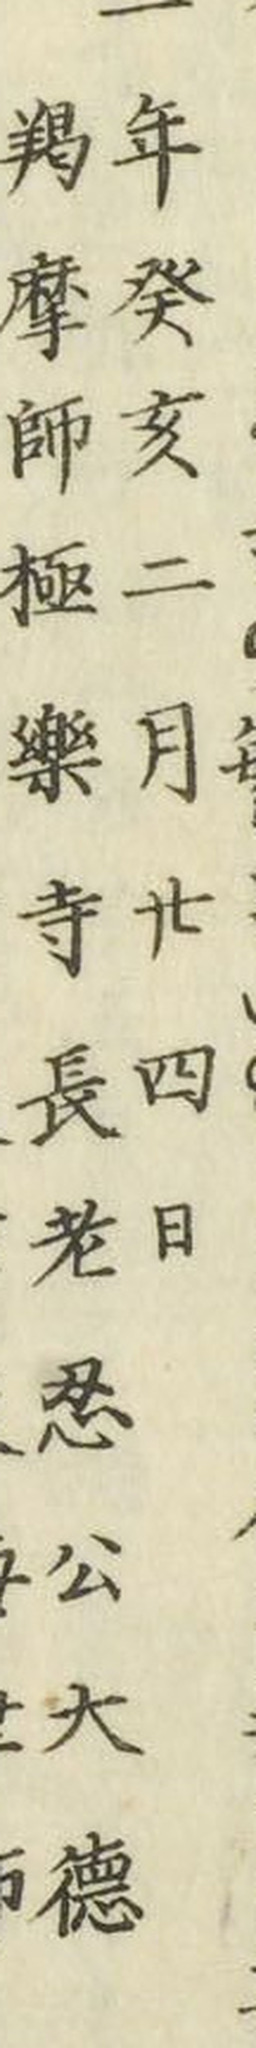羯摩師極樂寺長老忍公大德
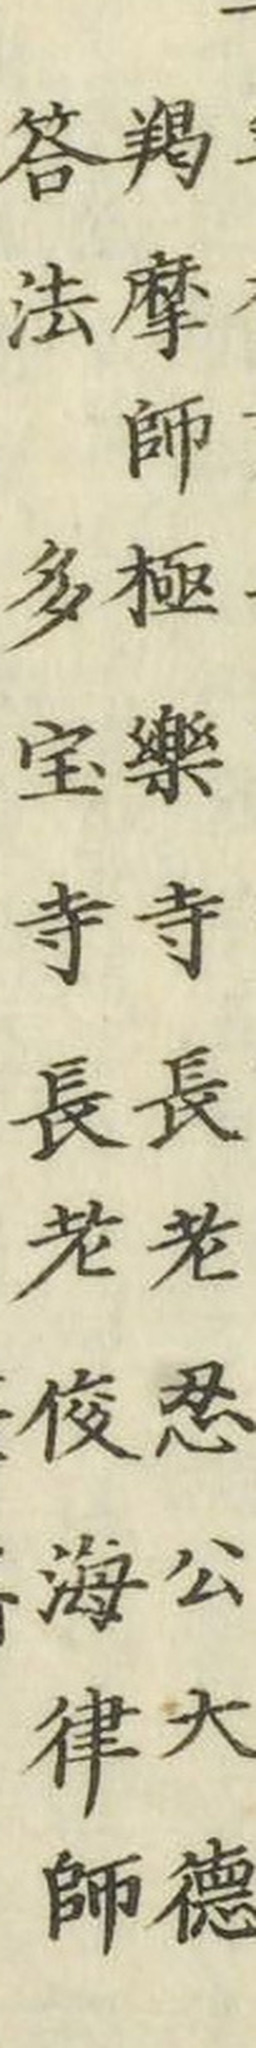答法多宝寺長老俊海律師
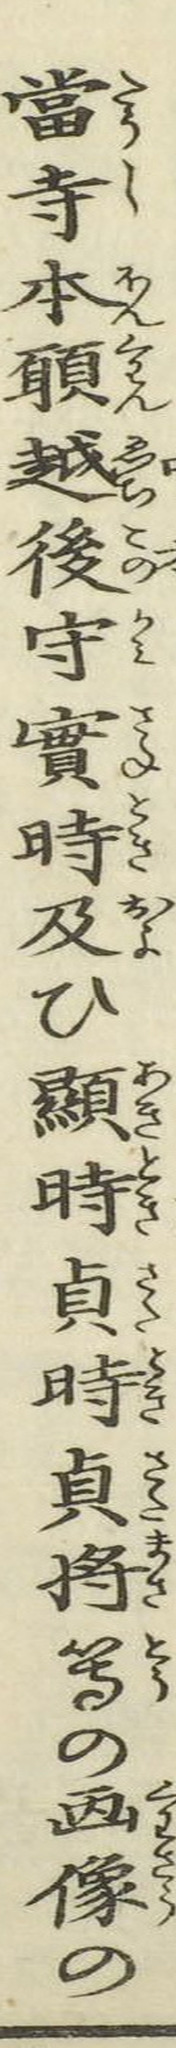當寺本願越後守實時及ひ顕時貞時貞將等の画像の
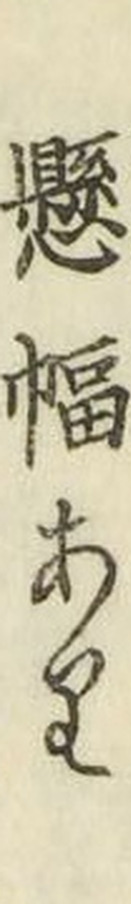懸幅あり
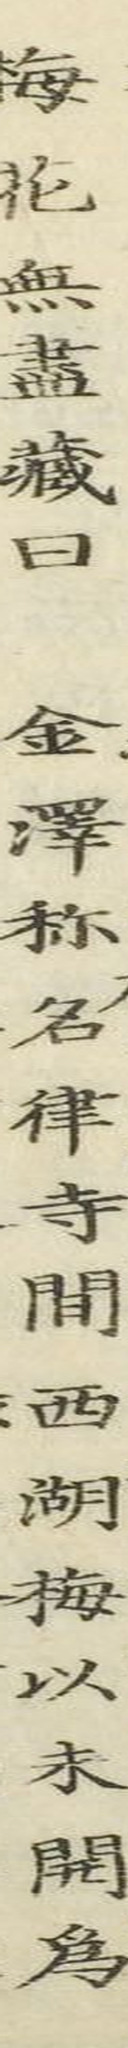梅花無盡藏曰金澤称名律寺間西湖梅以来開爲
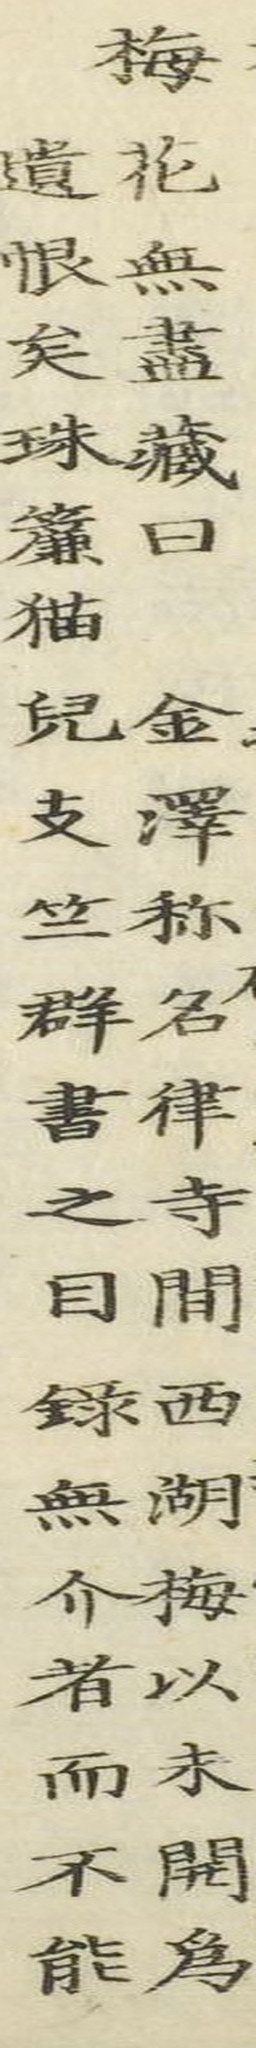遺恨矣珠簾猫兒支竺群書之目錄無介者而不能
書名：江戸名所図会 20巻 巻之6
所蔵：東京学芸大学教育コンテンツアーカイブ
